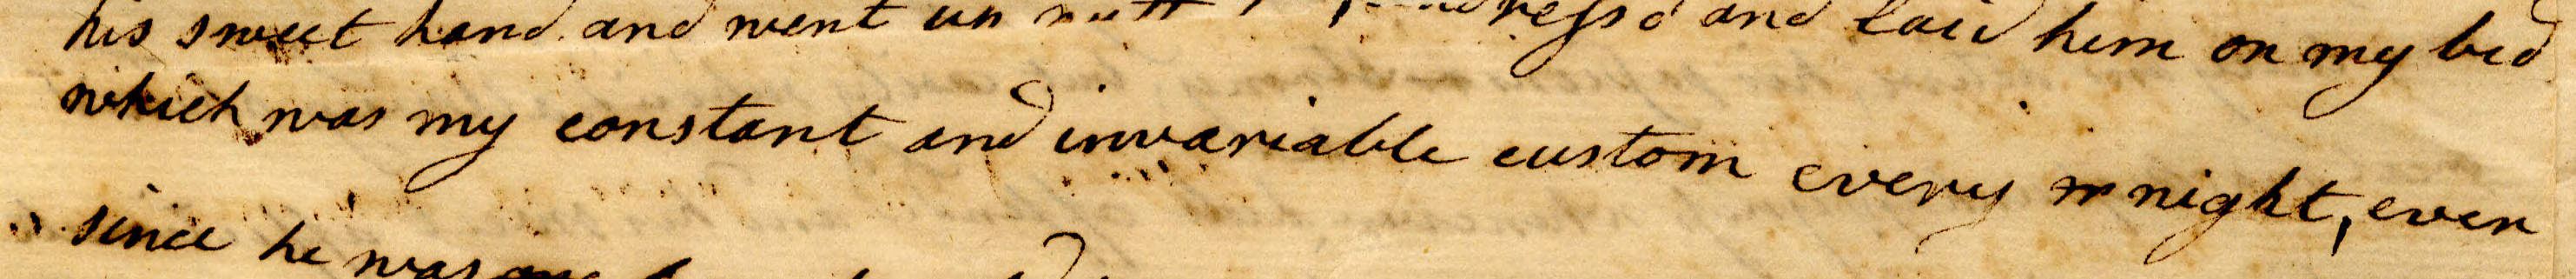which was my constant and invariable custom every night, even
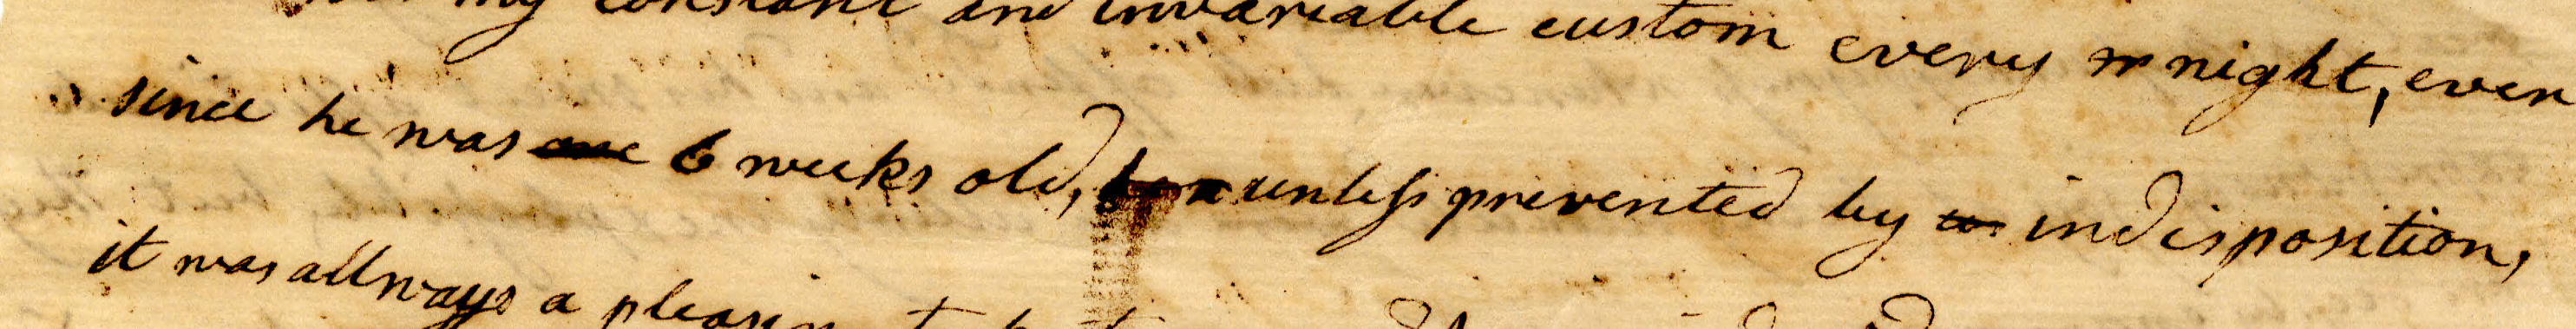since he was 6 weeks old, [___] unless prevented by indisposition,
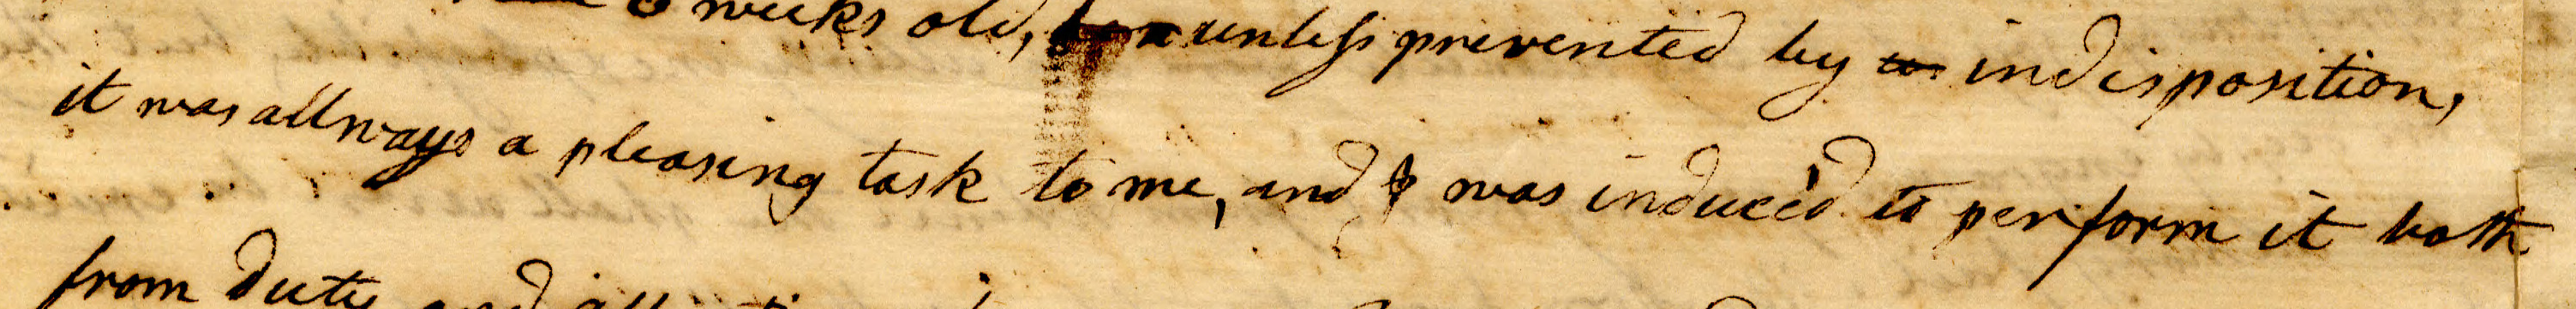it was allways a pleasing task to me, and was induced to perform it both
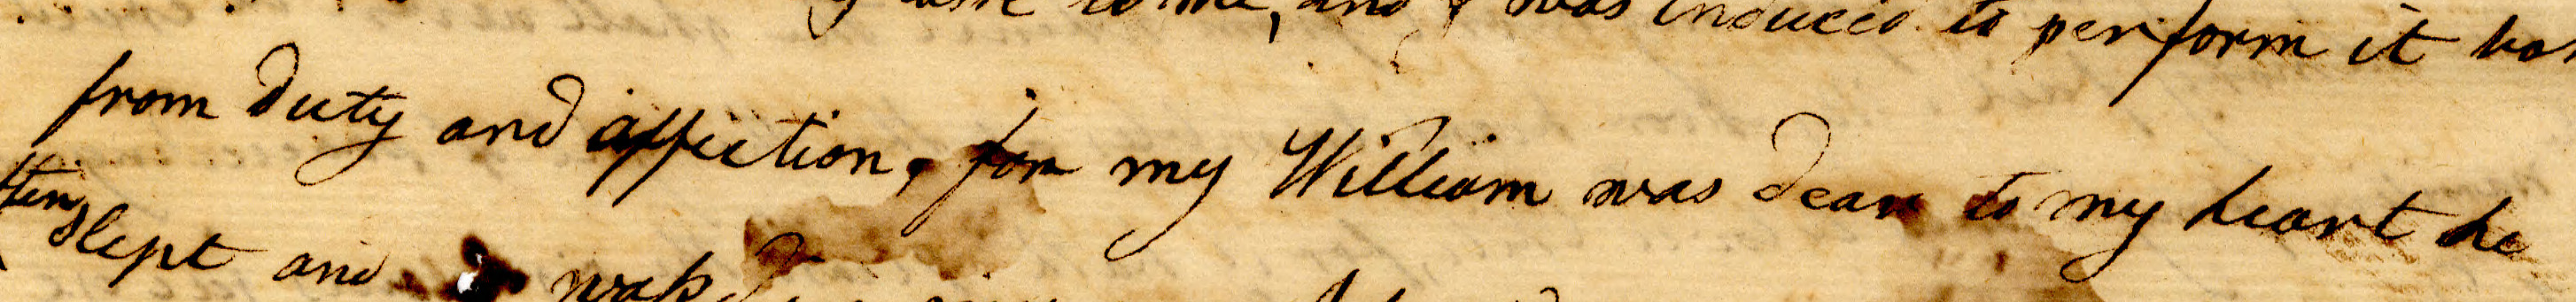from duty and affection, for my William was dear to my heart he
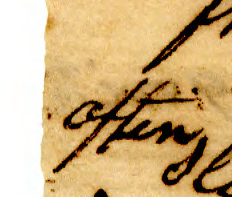often
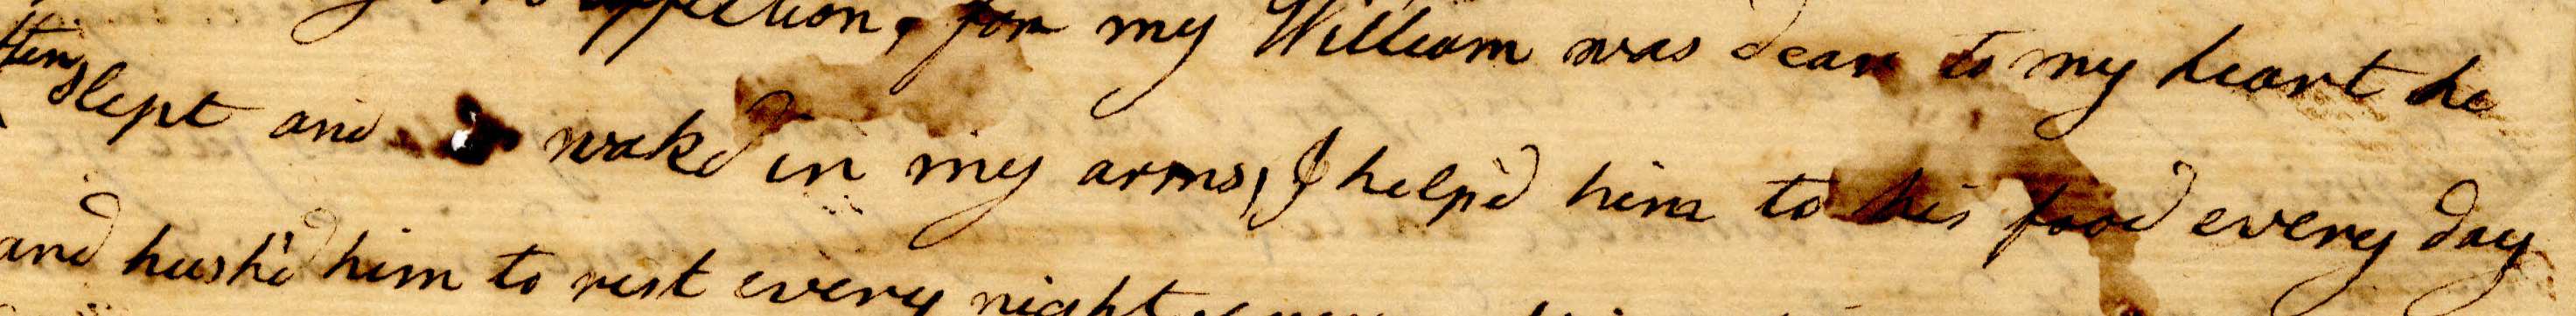slept and wakd in my arms, I help'd him to his food every day
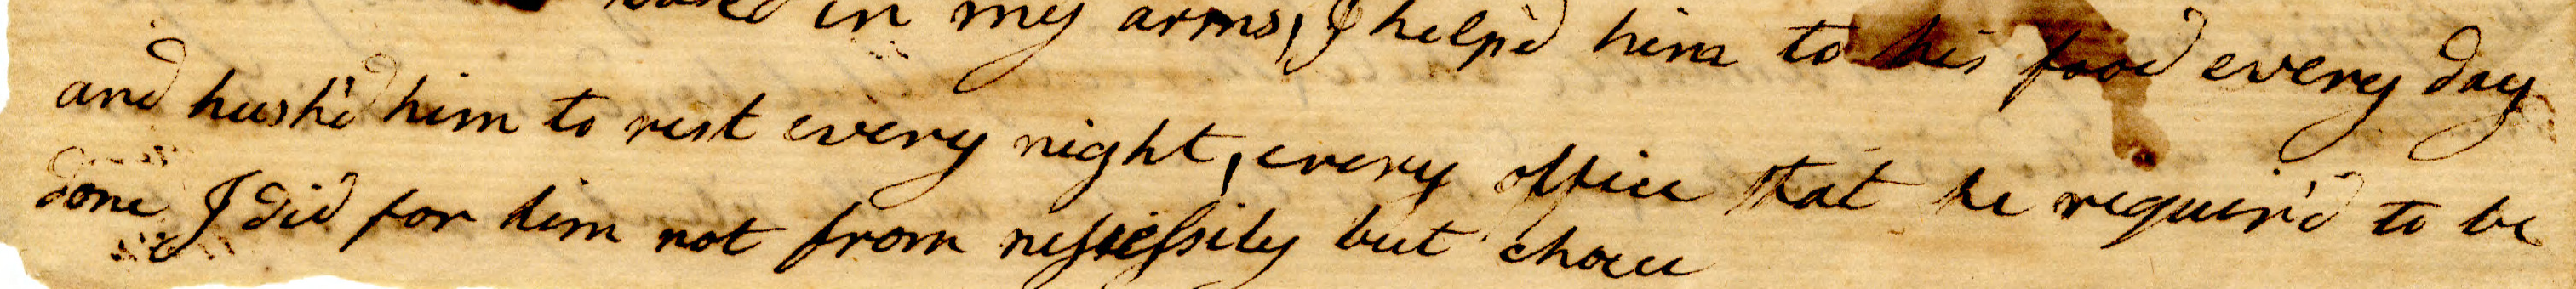and hush'd him to rest every night, every office that he requir'd to be
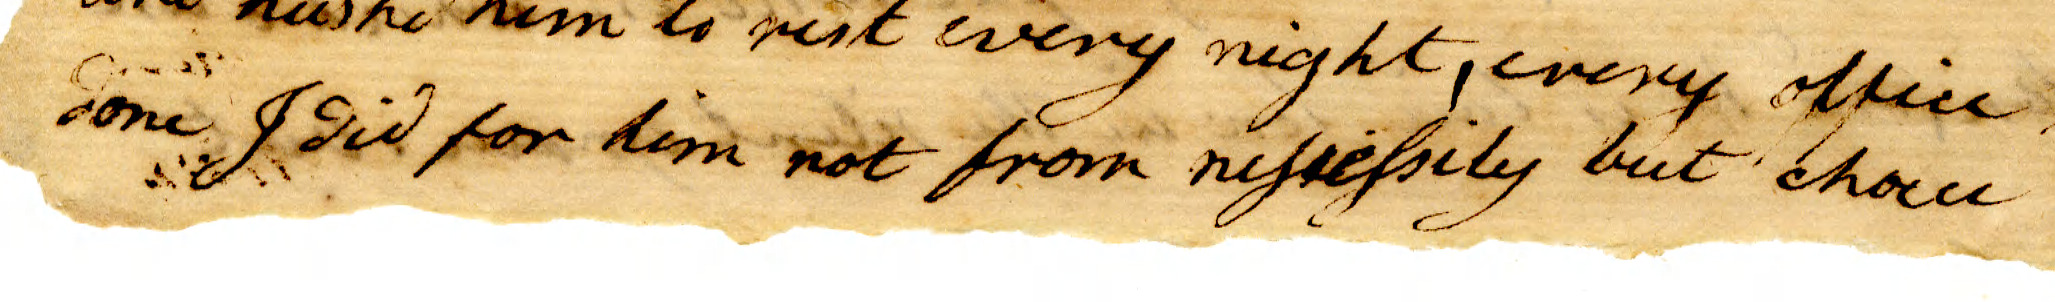done I did for him not from nessessity but choice
